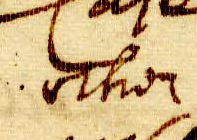other
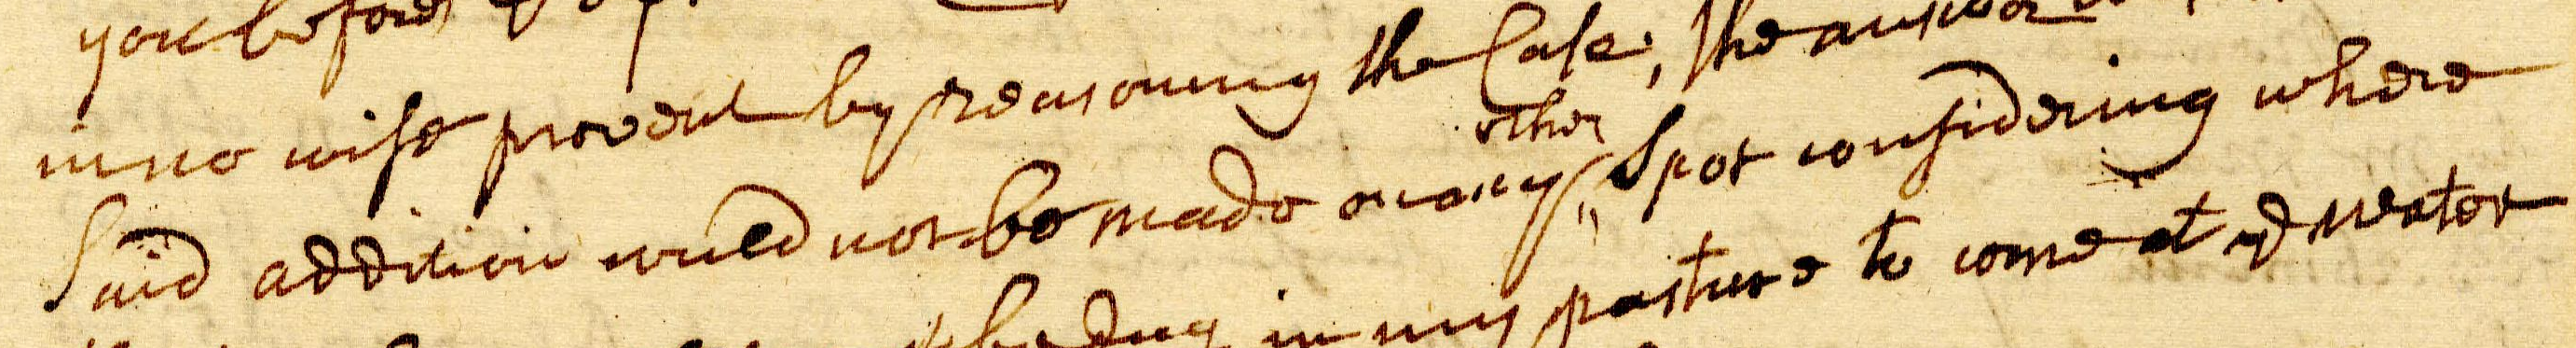Said addition wuld not be made on any ^ spot considering where
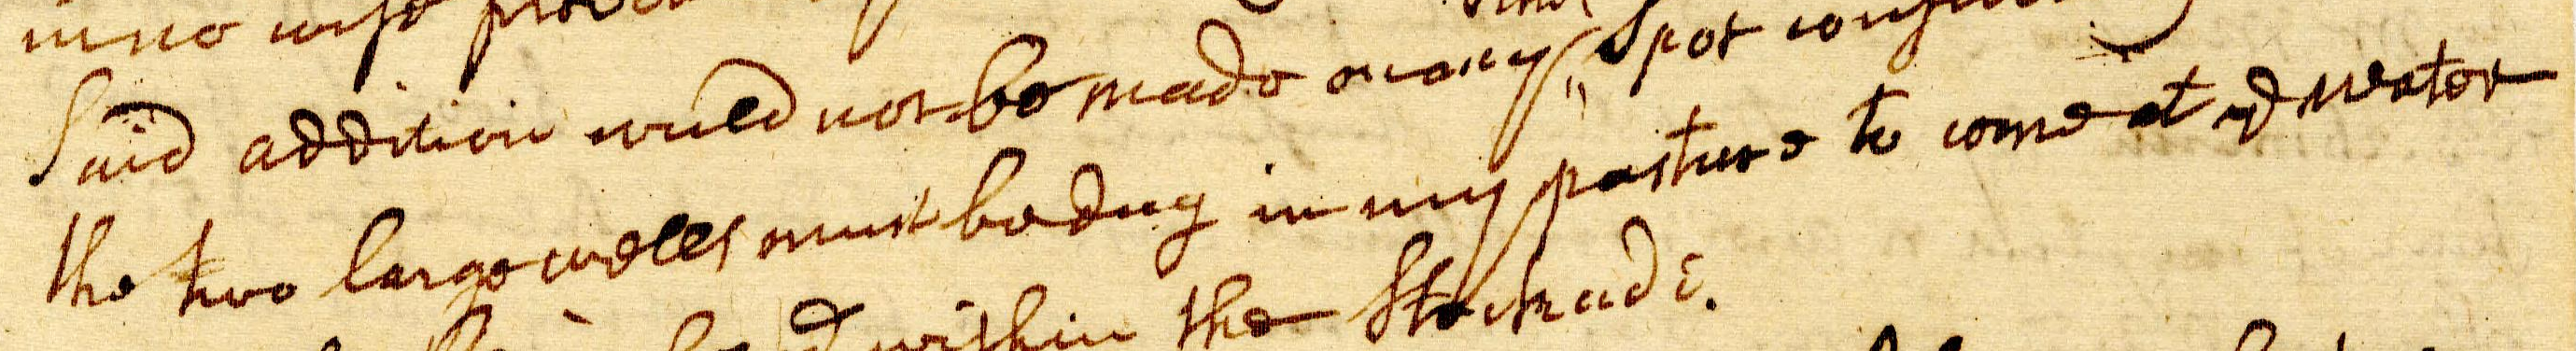the two largo wells must be dug in my pasture to come at y^e water
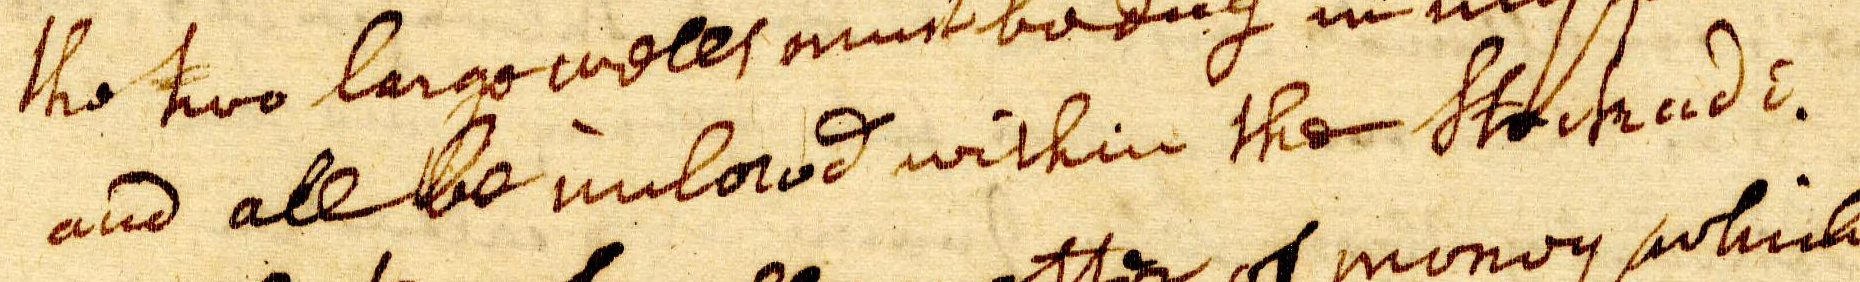and all be {included} within the Stockade.
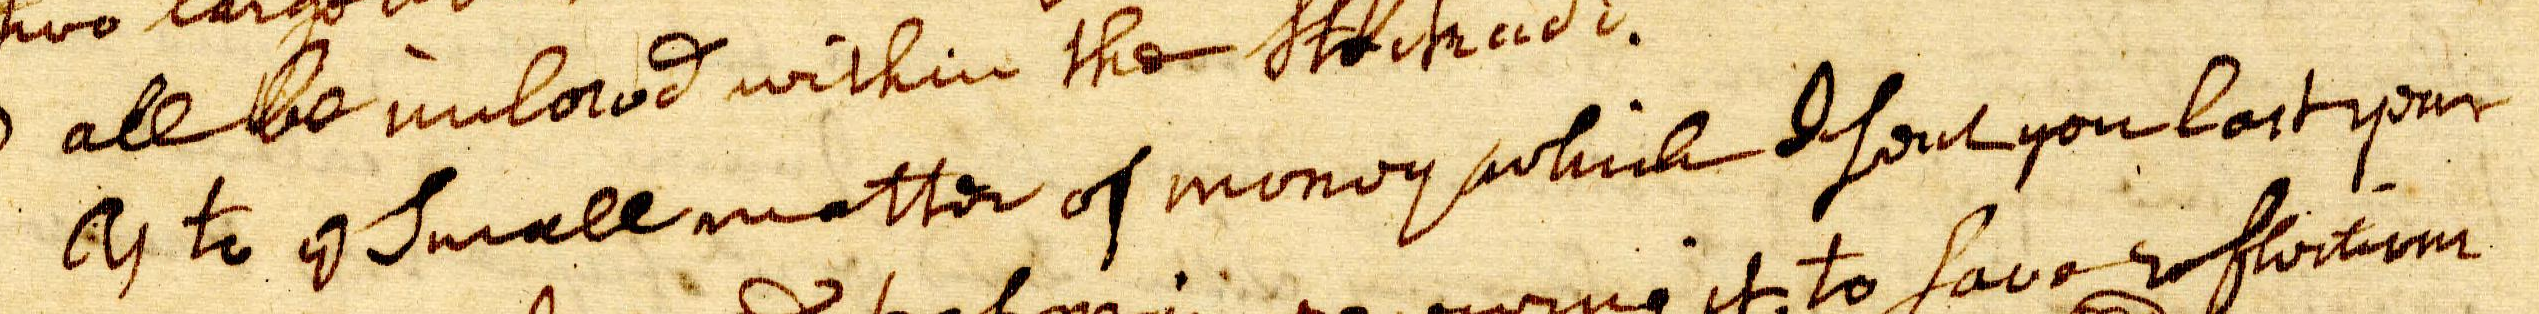As to y^e small matter of money which I Lent you last year
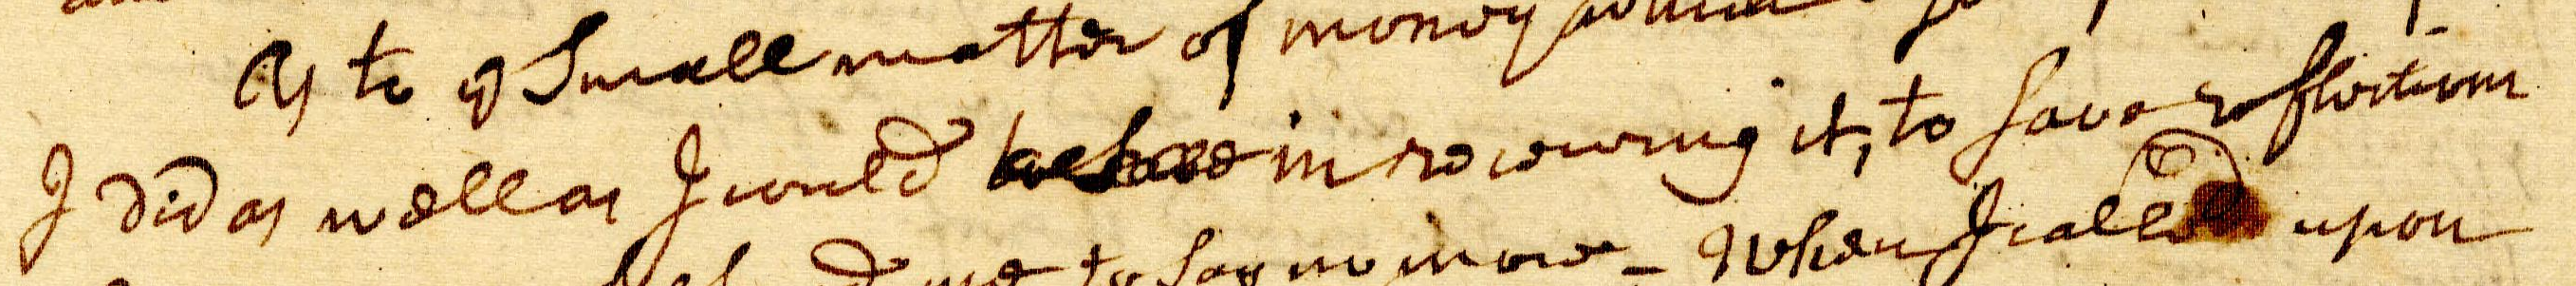I did well as I could [before] in recovering it, to save reflection
